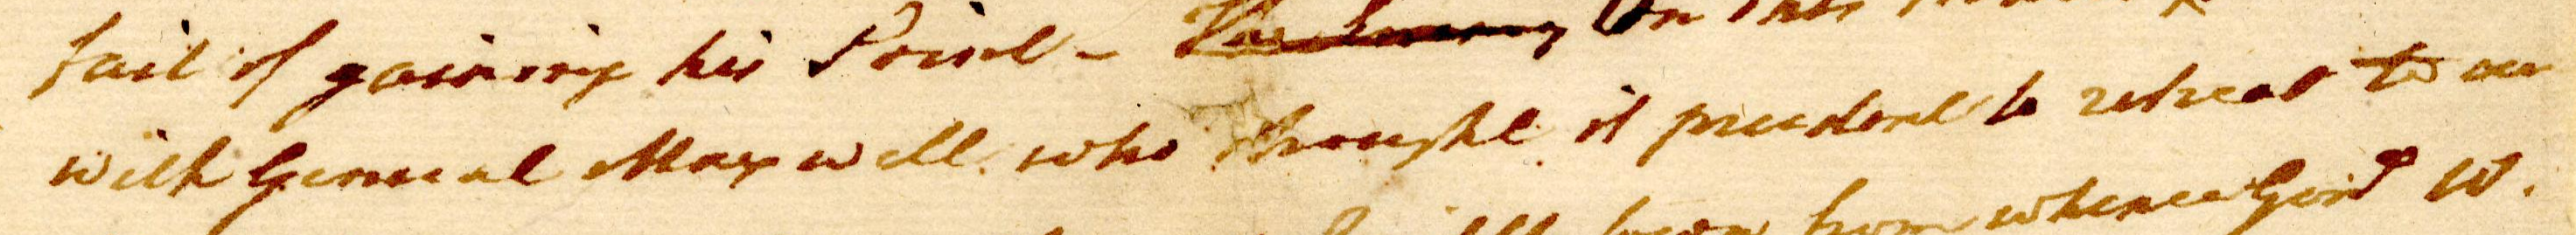with General Maxwell who thought it prudent to retreat to our
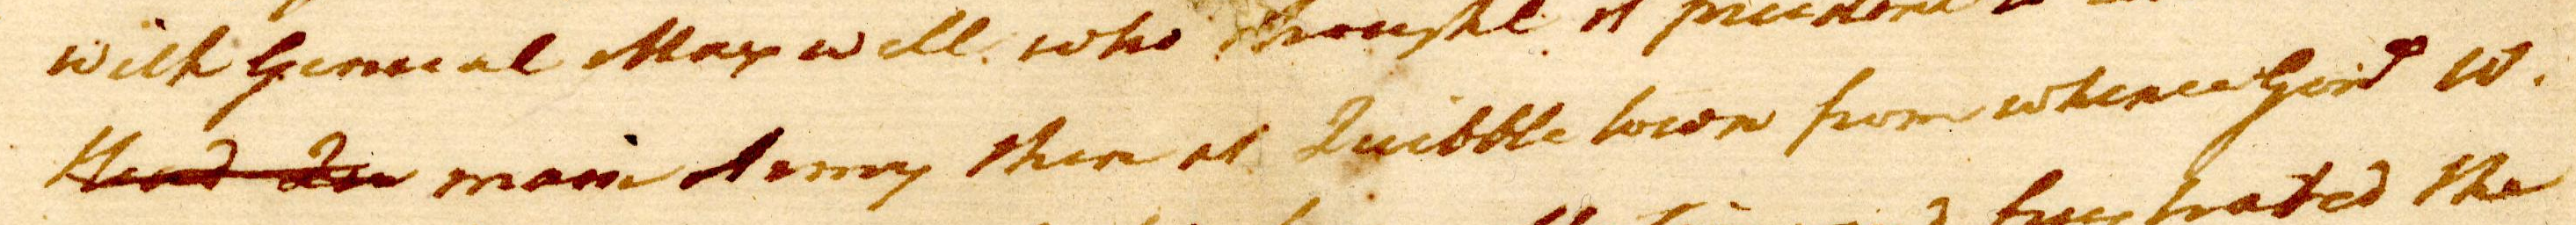[Head Qu] main Army then at Quibble town from whence Gen^l. W
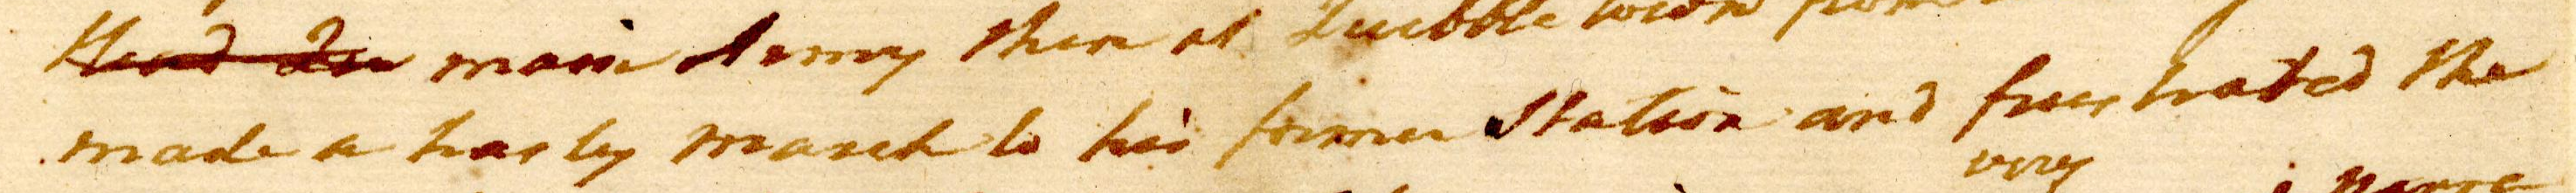made a hasty march to his former Station and frustrated the
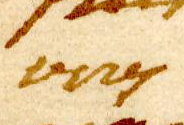very
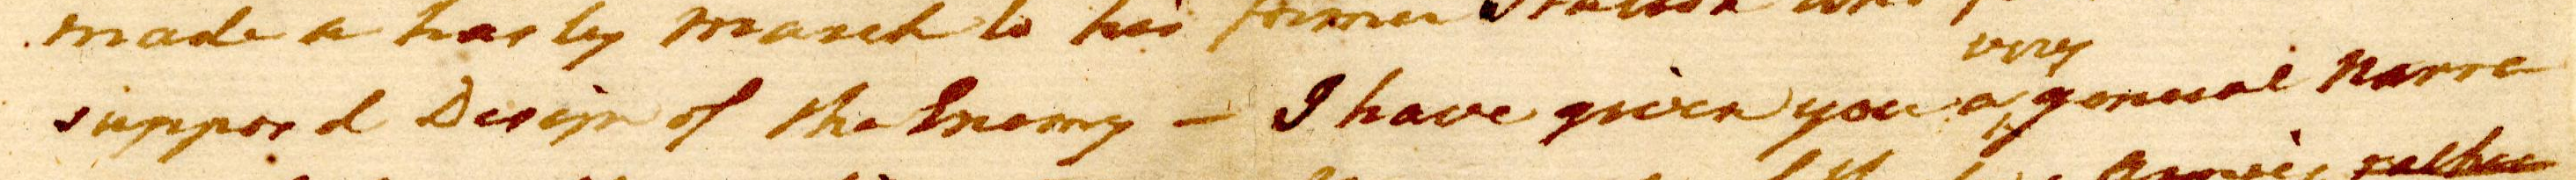suppossd Design of the Enemy- I have given you a ^ general narra
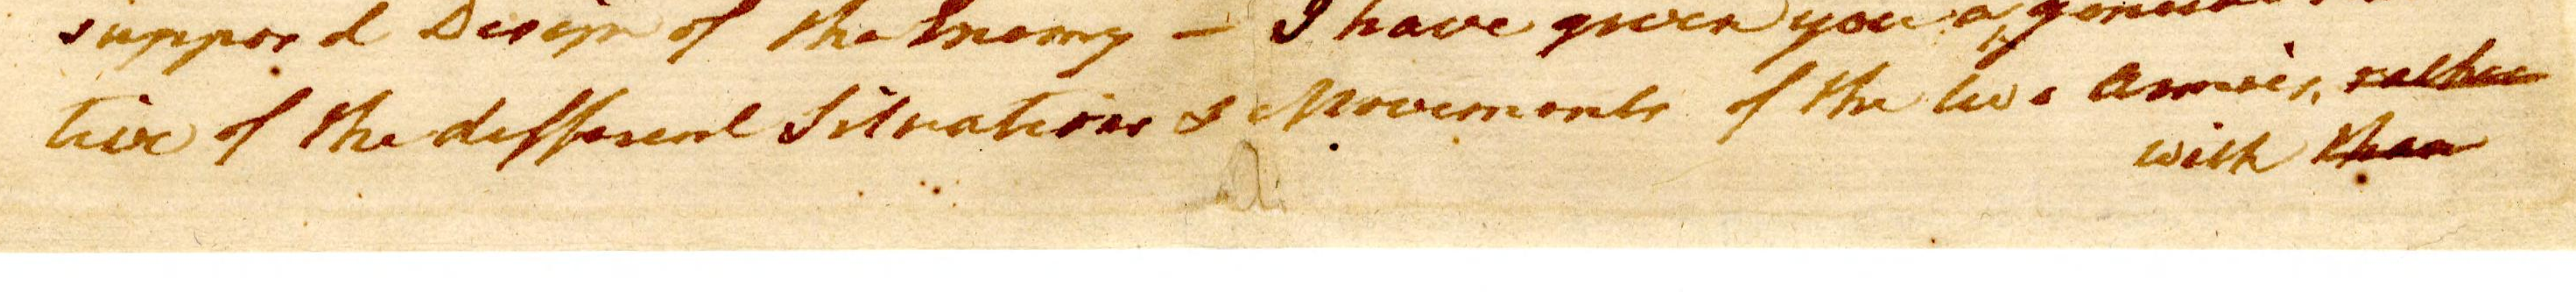tive of the different situations & apointments of the we Armies [rather]
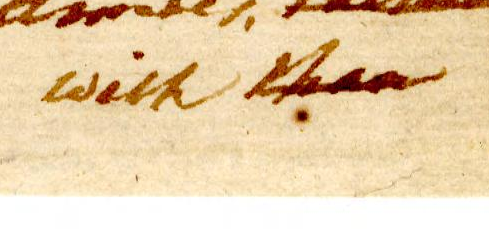with [than]
